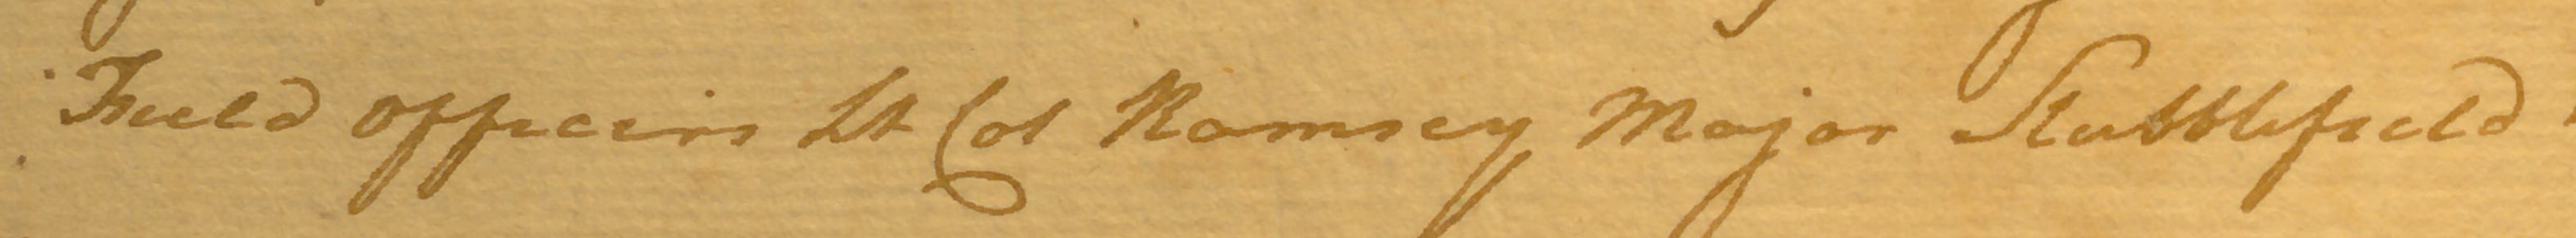Field officers Lt Col Ramsey Major Stubblefield
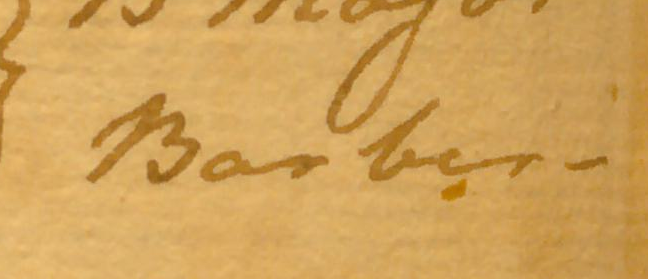Barber-
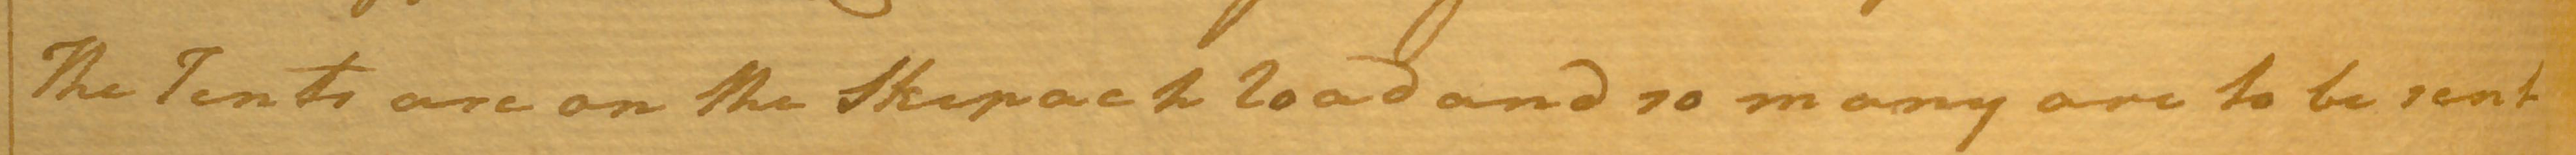The Tents are on the Skipack road and so many are to be sent
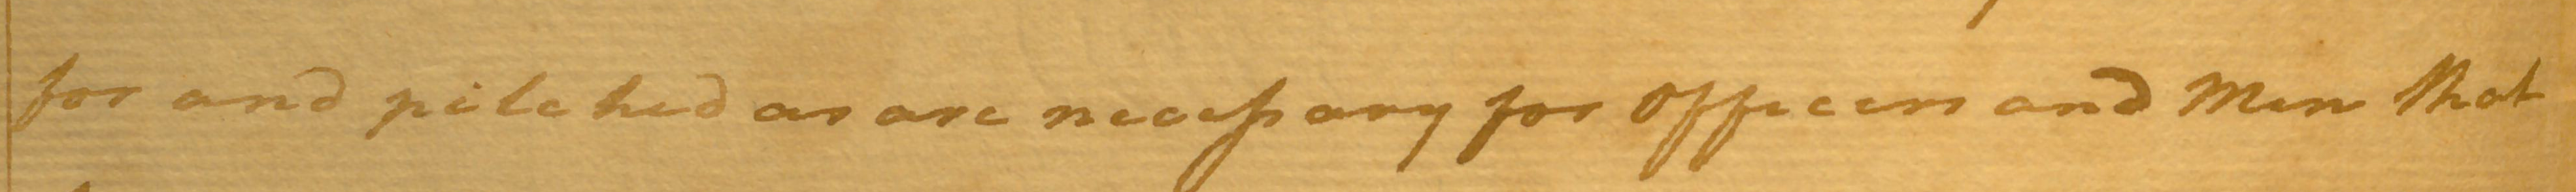for and pitched as are necessary for officers and Men that
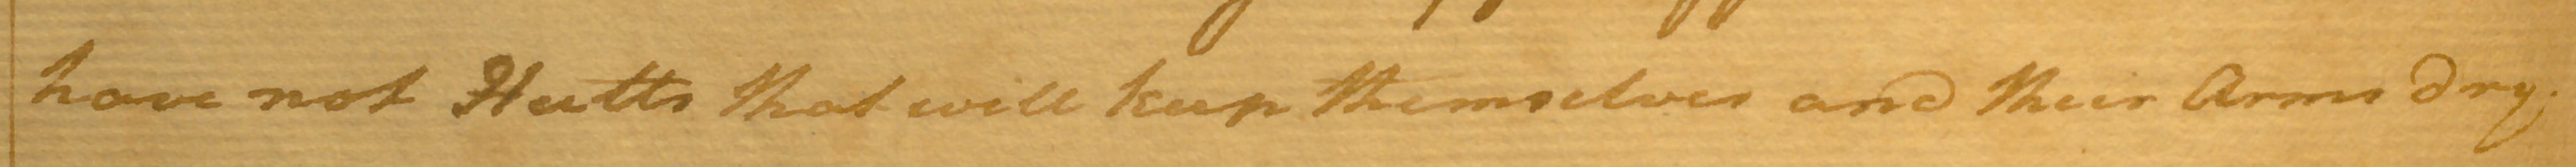have not Hutts that will keep themselves and their Arms dry.
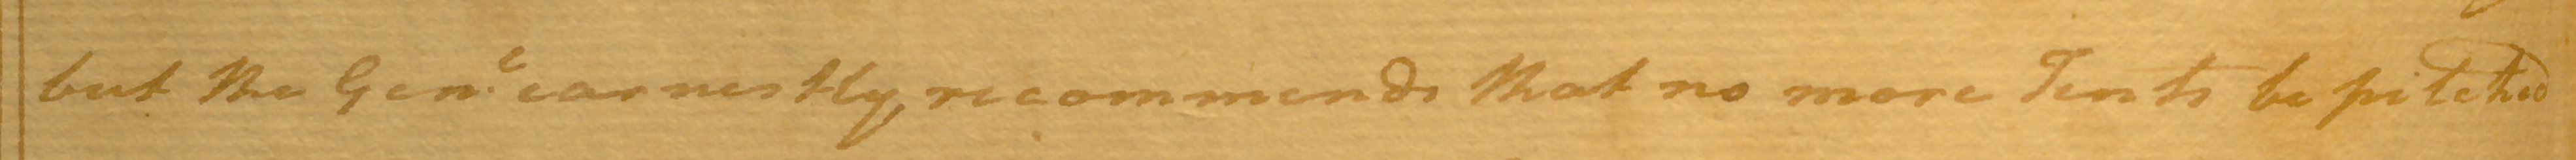but the Gen^l. earnestly recommends that no more Tents be pitched
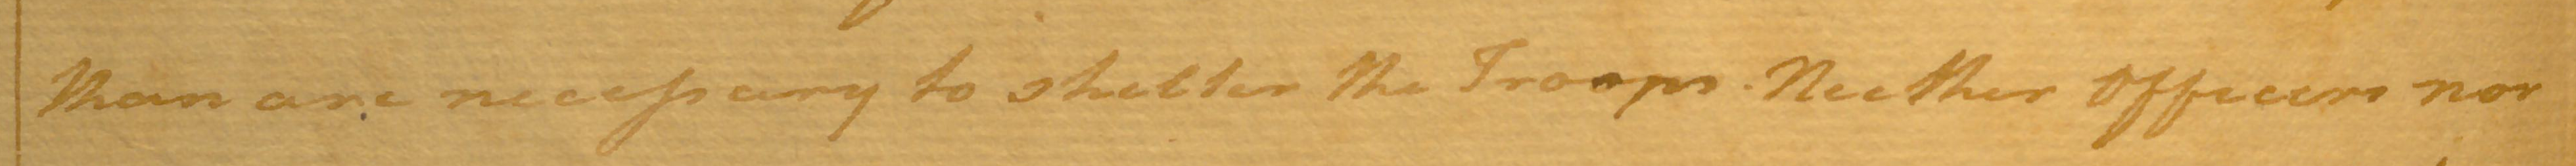than are necessary to shelter the Troops. Neither Officers nor
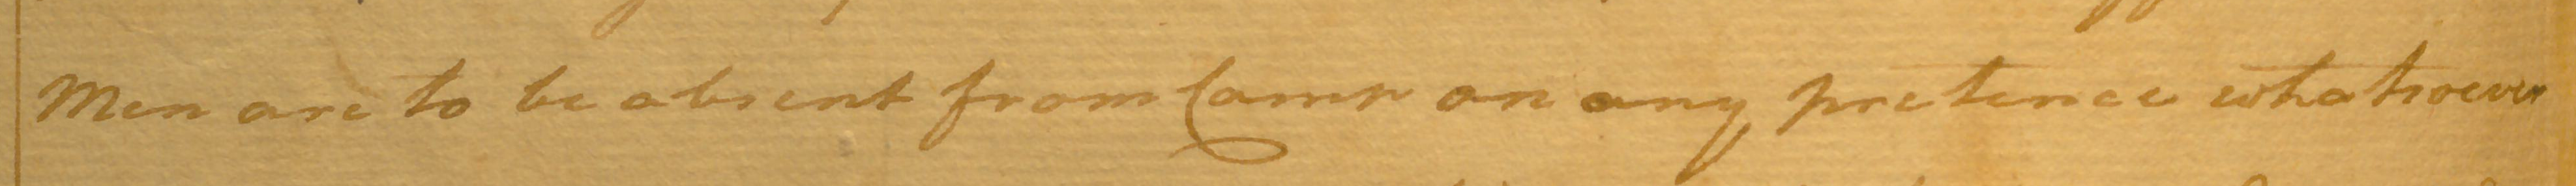Men are to be absent from Camp on any pretence whatsoever
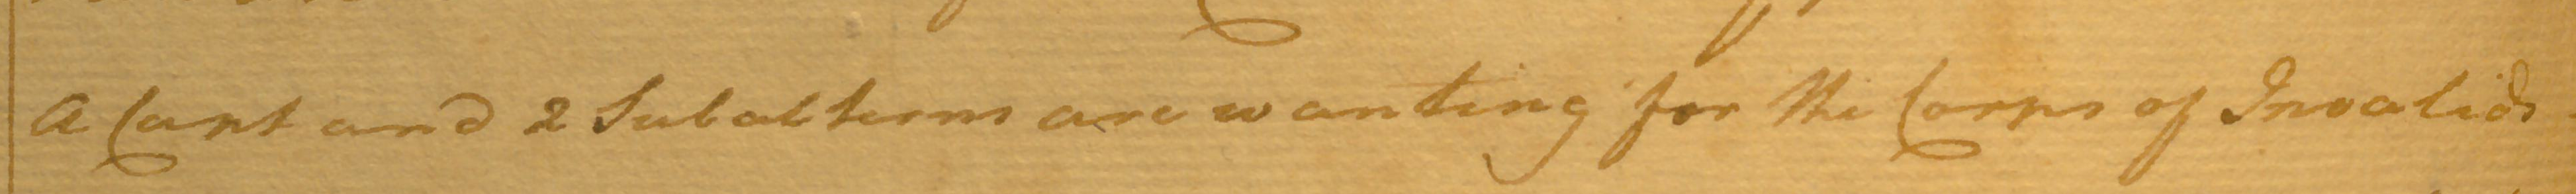A Capt and 2 Subalterns are wanting for the Corps of Invalids
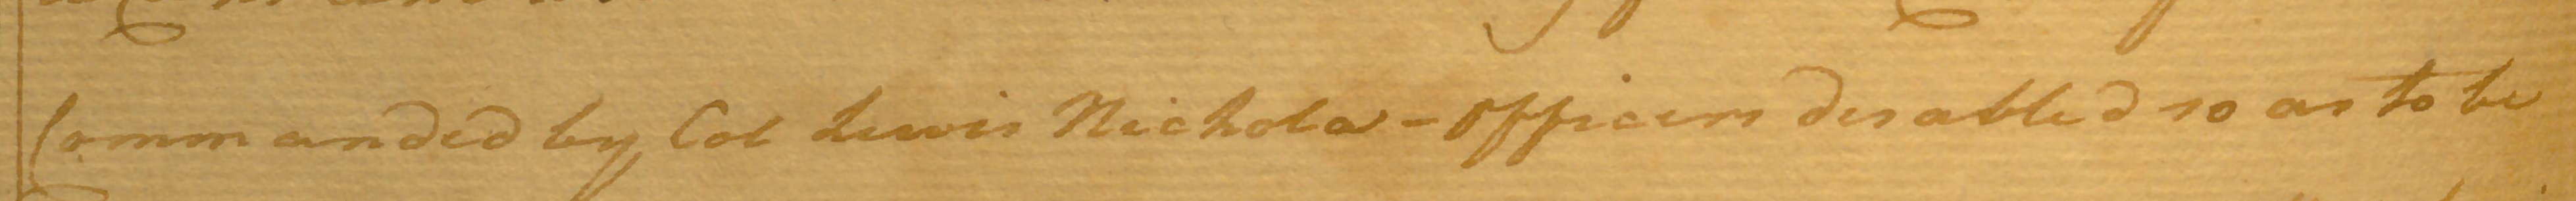Commanded by Col Lewis Nichola- Officers disabled so as to be
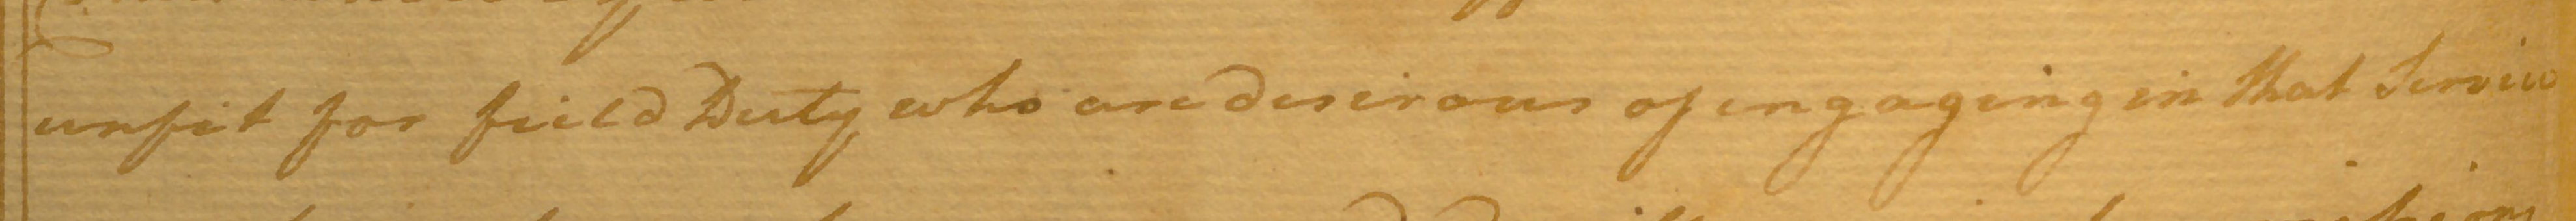unfit for field Duty who are desirous of engaging in that Service
